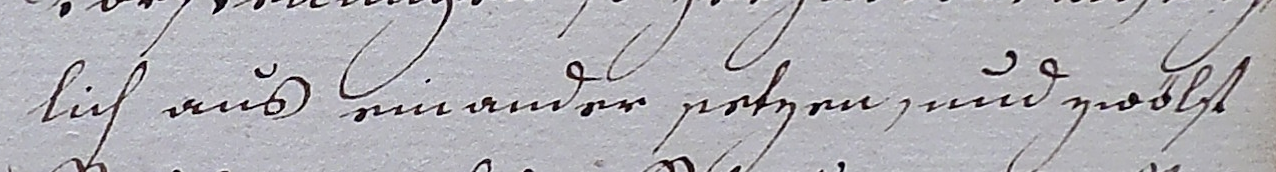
lich aus einander setzen, und zwölf
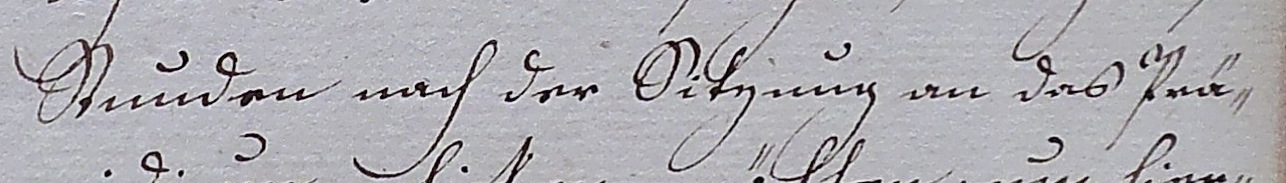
Stunden nach der Sitzung an das Prä¬
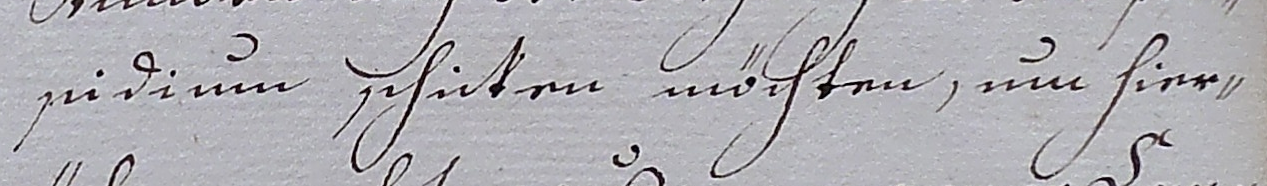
sidium schicken möchten, um hier¬
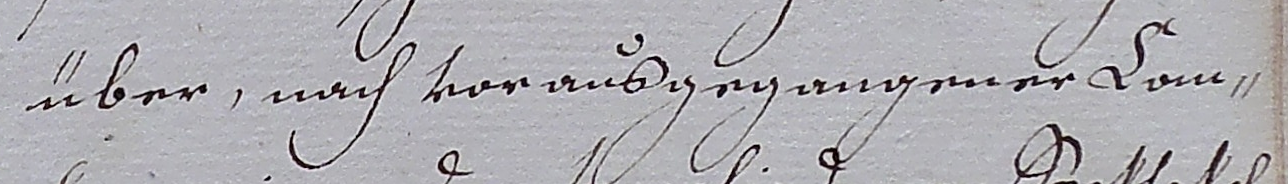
über, nach vorausgegangener Com¬
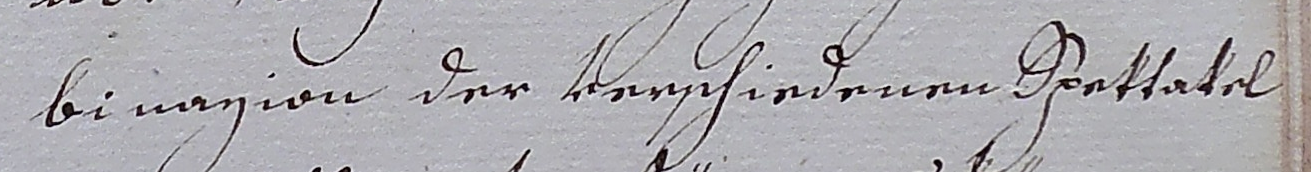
binazion der verschiedenen Spektakel
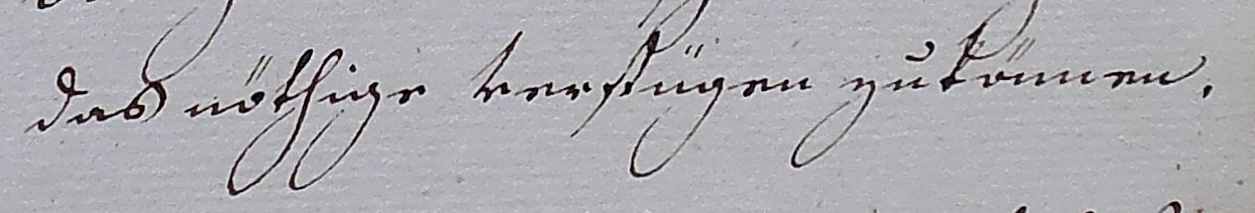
das nöthige verfügen zukönnen.
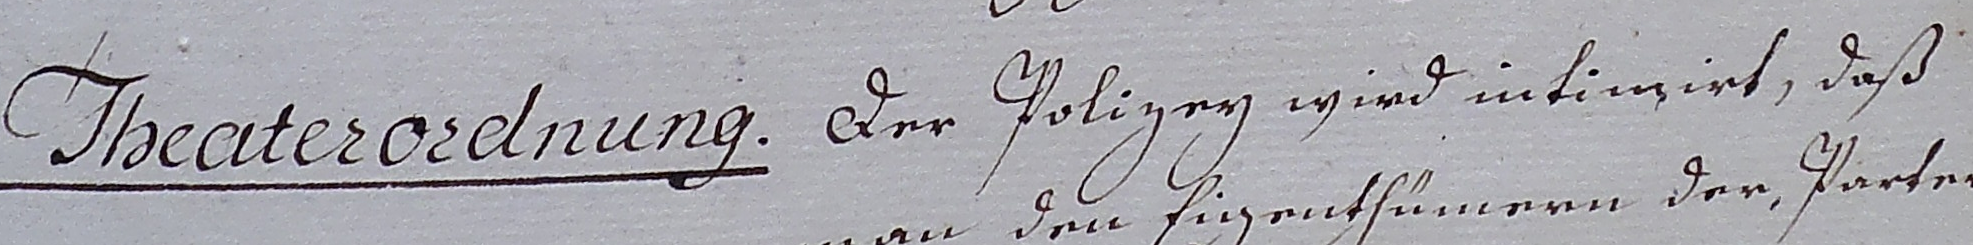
Theaterordnung. Der Polizey wird intimirt, daß
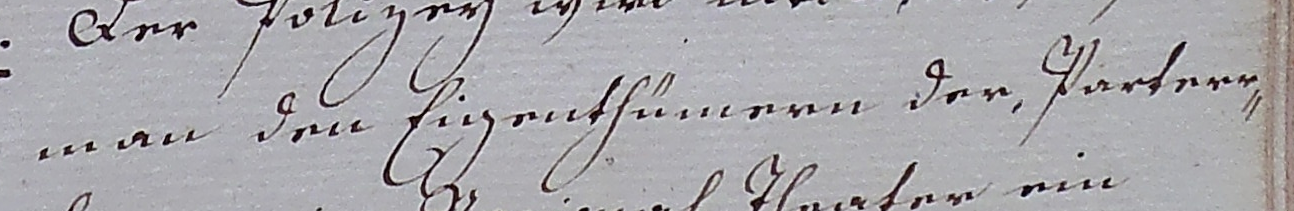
man den Eigenthümern der Parterr¬
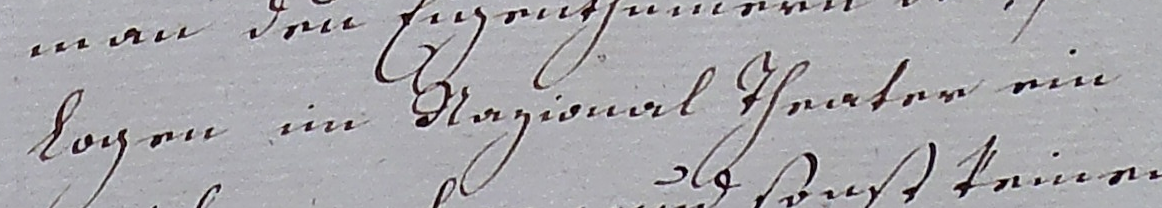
logen im Nazional Theater ein
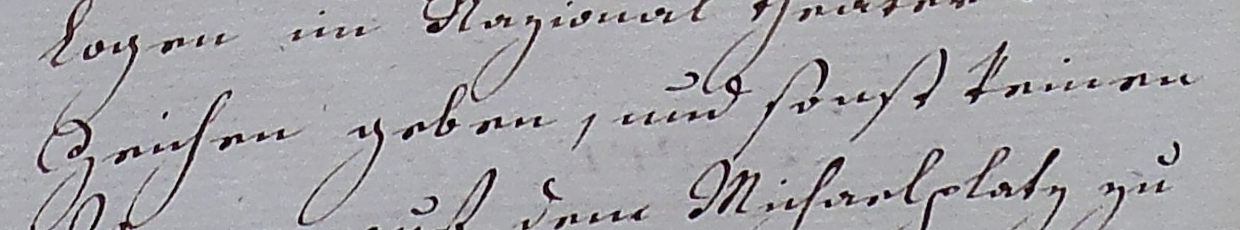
Zeichen geben, und sonst keinen
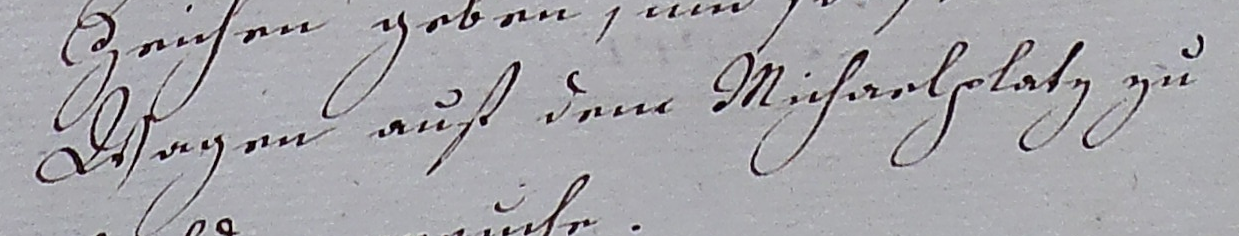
Wagen auf dem Michaelplatz zu
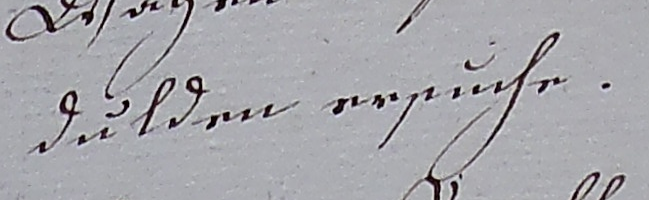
dulden ersuche.
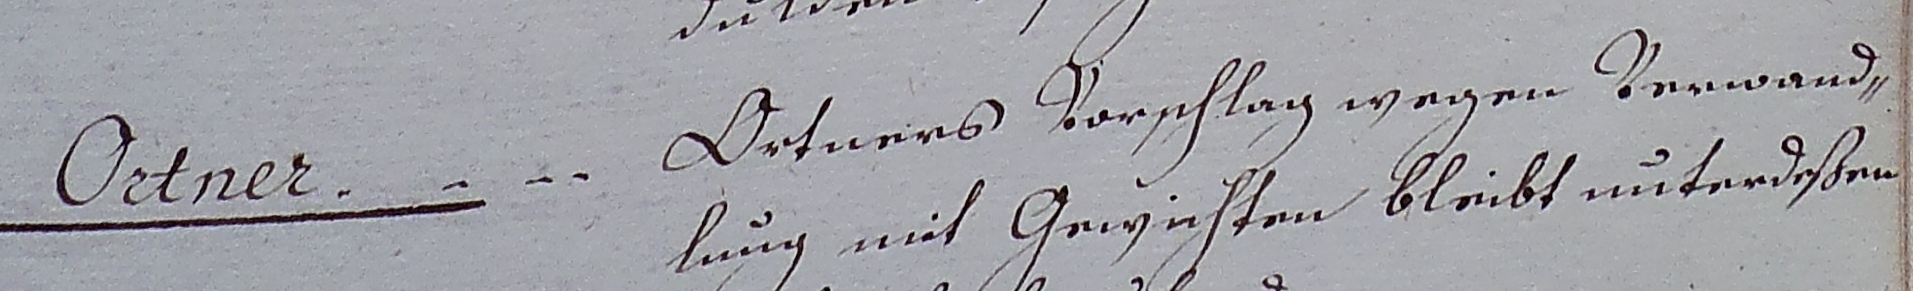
Ortner. .. .. . Ortners Vorschlag wegen Verwand¬
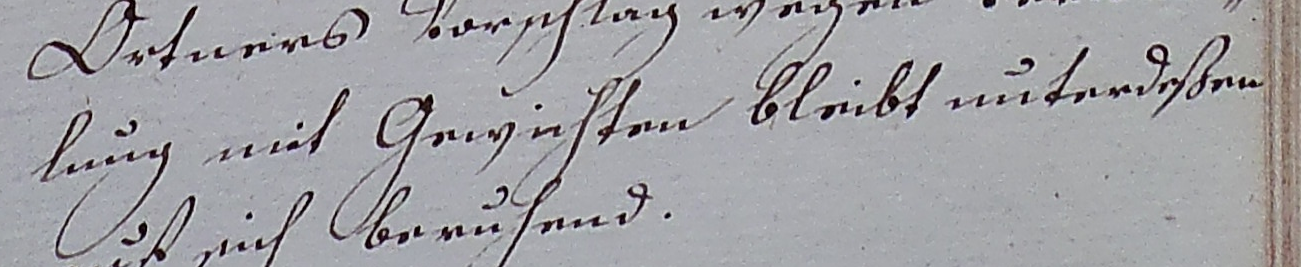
lung mit Gewichten bleibt unterdeßen
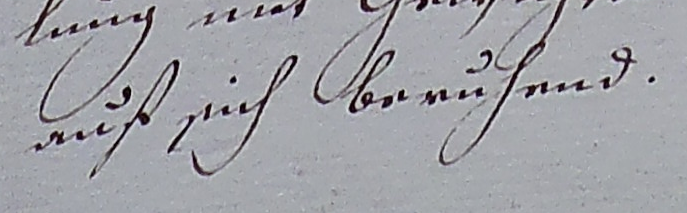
auf sich beruhend.
